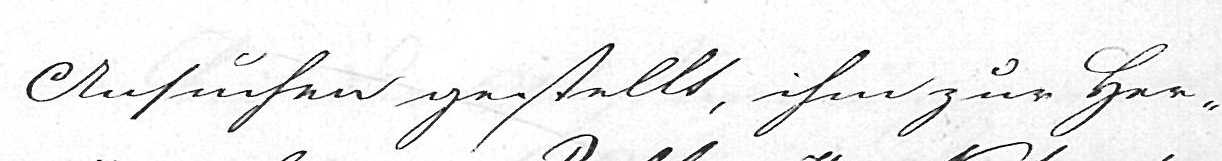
Ansuchen gestellt, ihm zur Her-
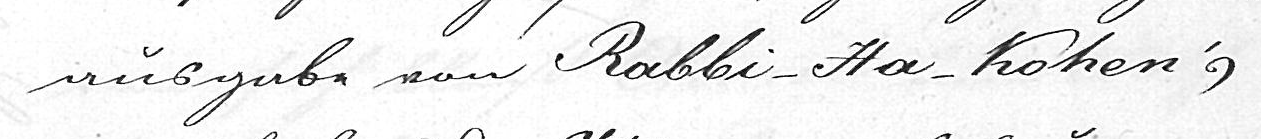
ausgabe von Rabbi-Ha-Kohen's
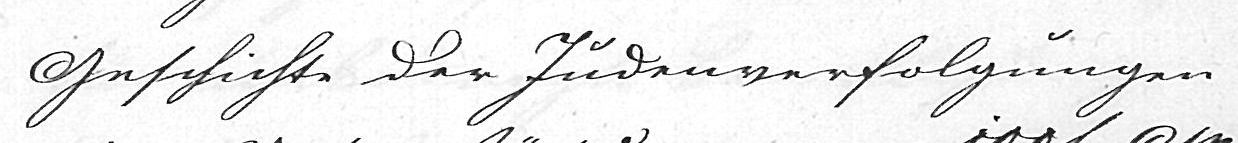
Geschichte der Judenverfolgungen
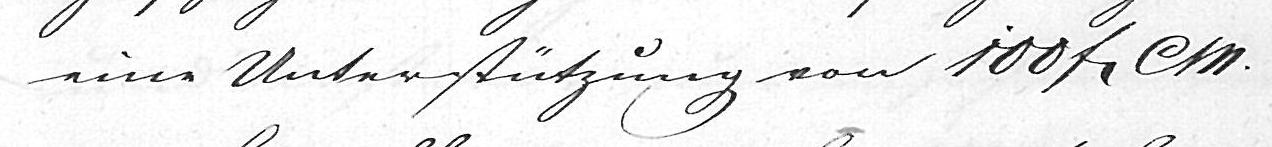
eine Unterstützung von 100 fr CM.
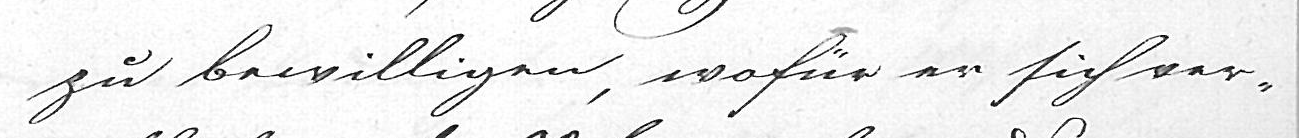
zu bewilligen, wofür er sich ver-
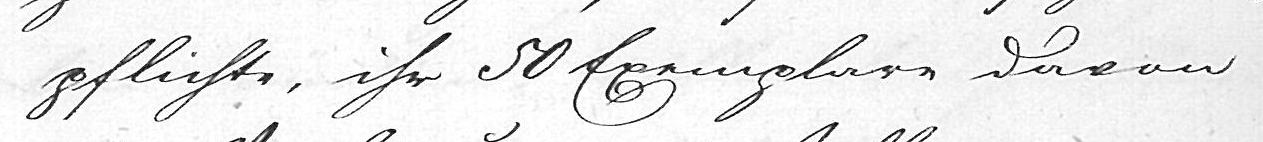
pflichte, ihr 50 Exemplare davon
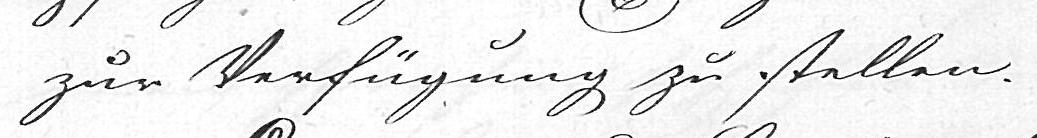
zur Verfügung zu stellen.
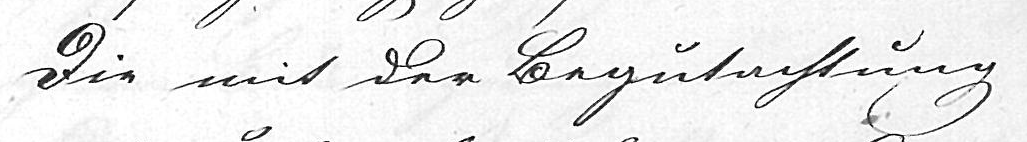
Die mit der Begutachtung
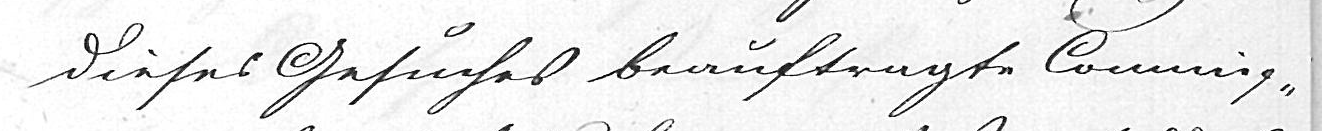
dieses Gesuches beauftragte Commis-
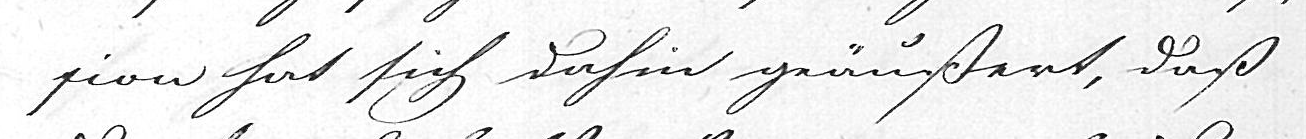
sion hat sich dahin geäußert, daß
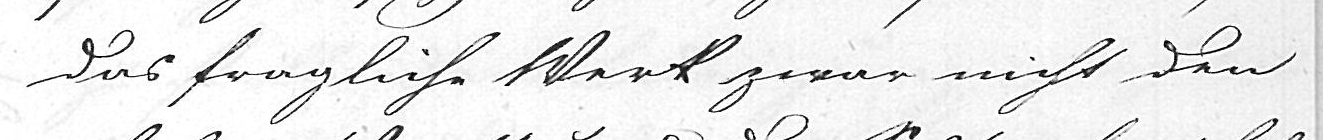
das fraglichen Werk zwar nicht den
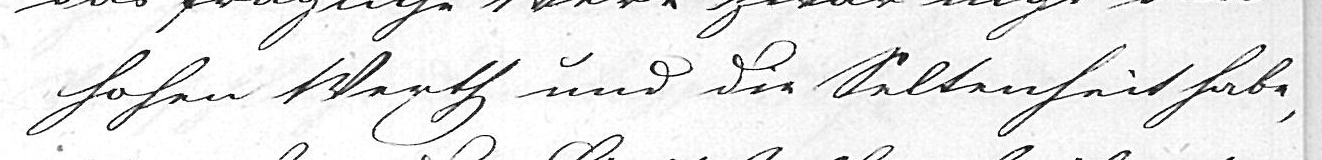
hohen Werth und die Seltenheit habe,
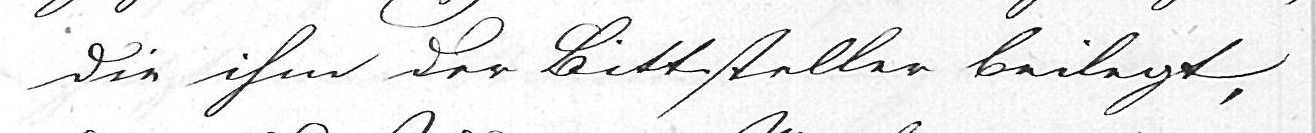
die ihm der Bittsteller beilegt,
